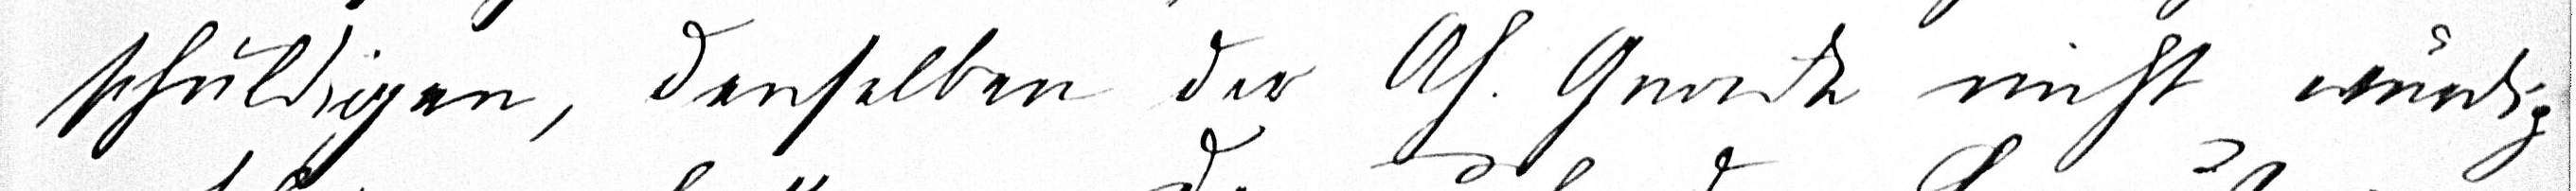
schuldigen, denselben der Ah. Gnade nicht würdig
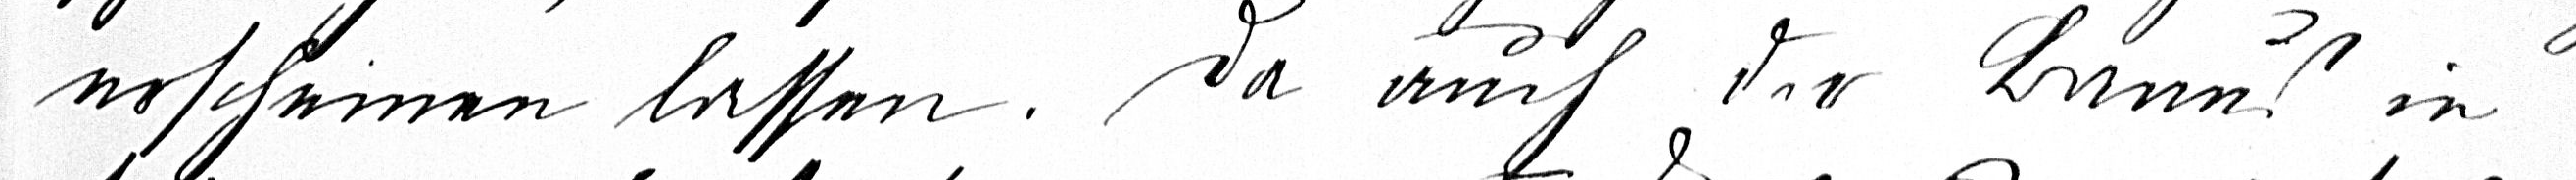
erscheinen lassen. Da auch der Banus in
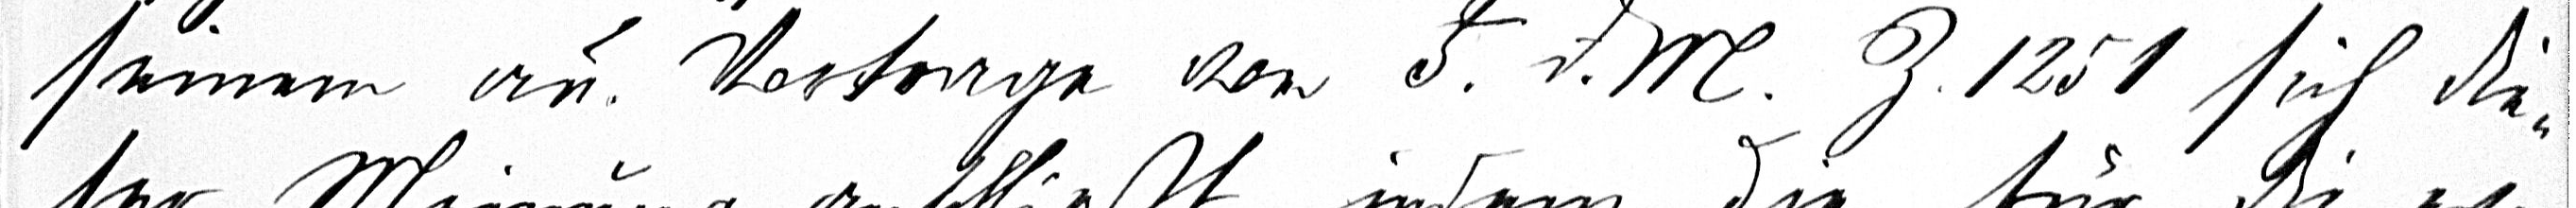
seinem au. Vertrage von 5. d. M. Z. 1251 sich die¬
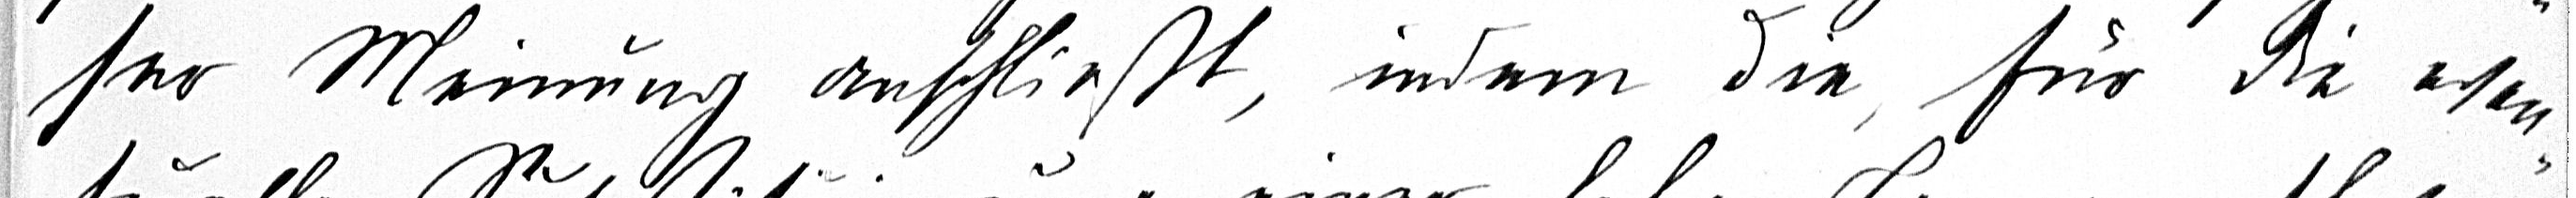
ser Meinung anschließt, indem die, für die even¬
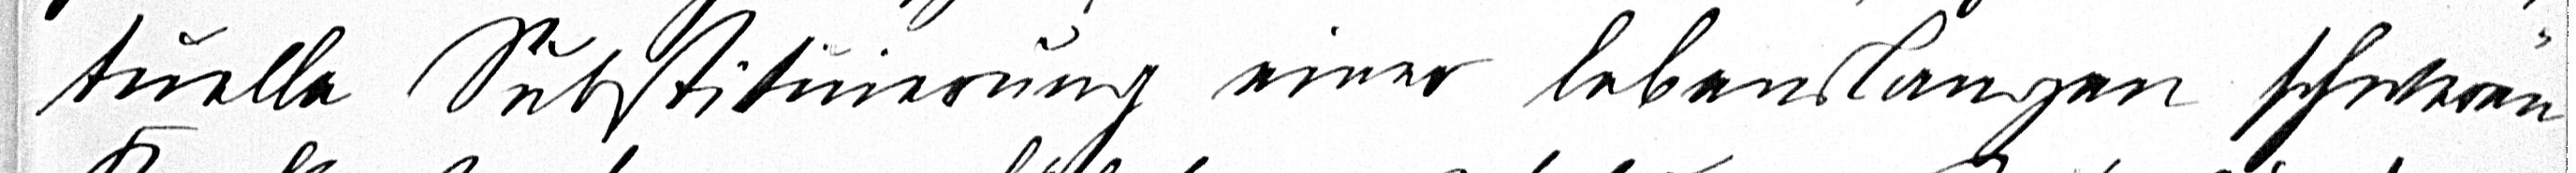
tuelle Substituierung einer lebenslangen schweren
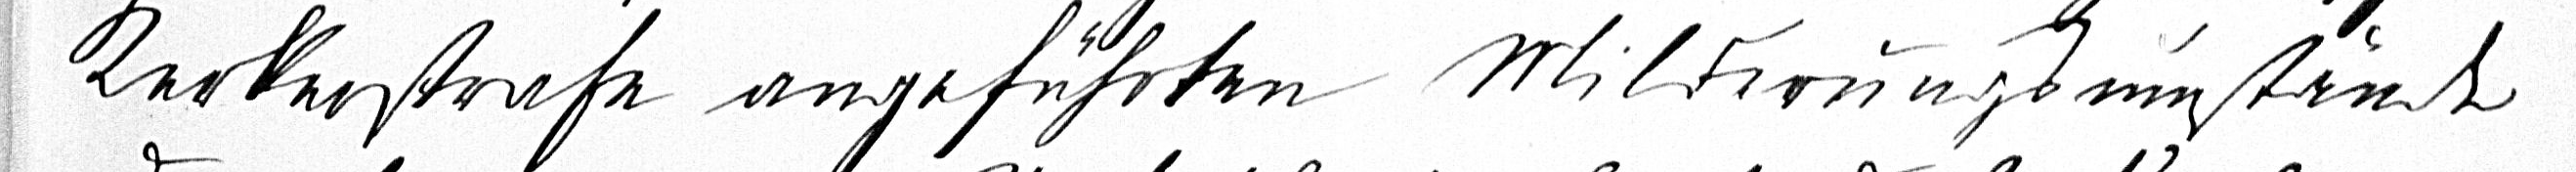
Kerkerstrafe angeführten Milderungsumstände
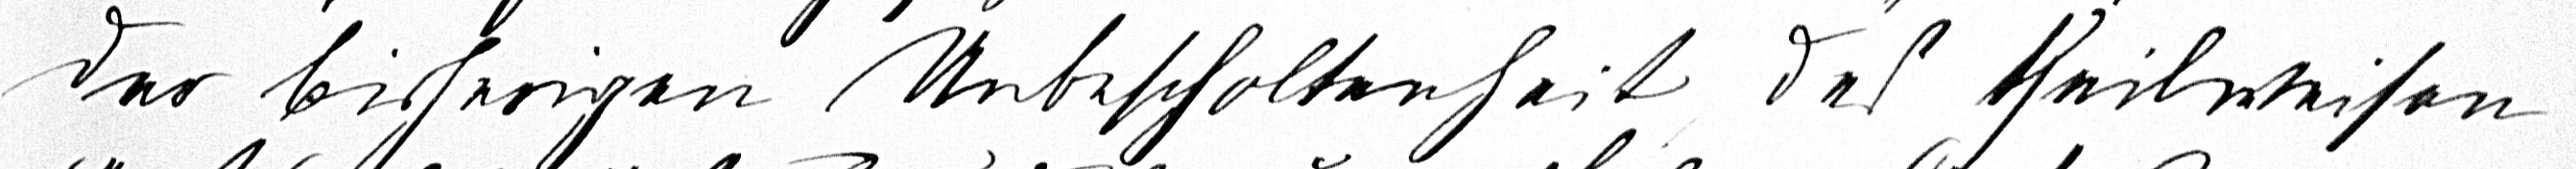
der bisherigen Unbescholtenheit des theilweisen
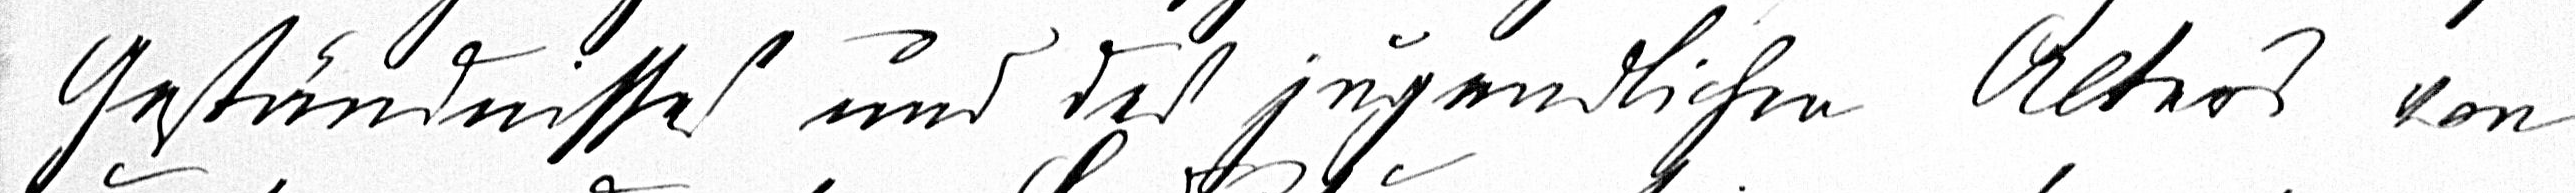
Geständnisses und des jugendlichen Alters von
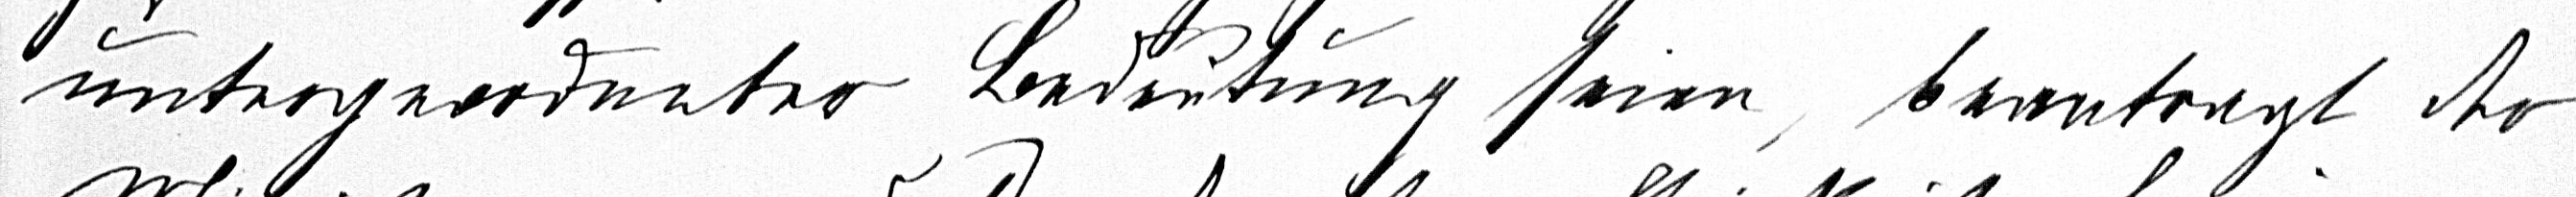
untergeordneter Bedeutung seien, beantragt der
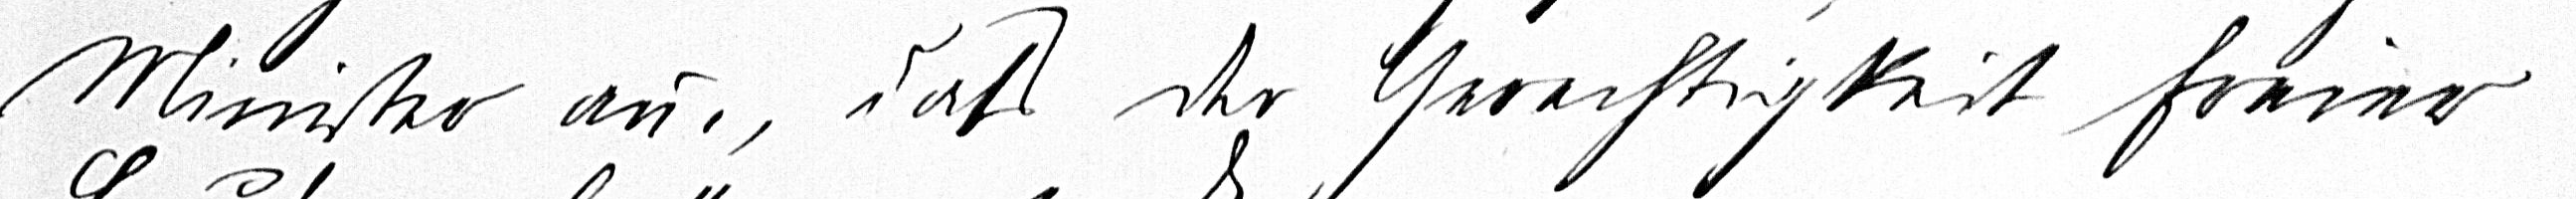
Minister au., daß der Gerechtigkeit freier
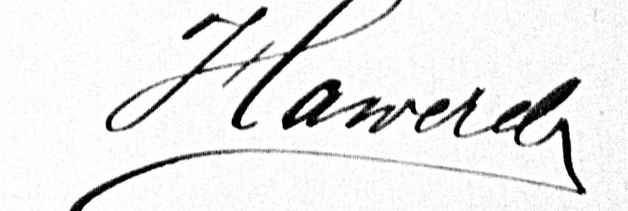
Hawerd
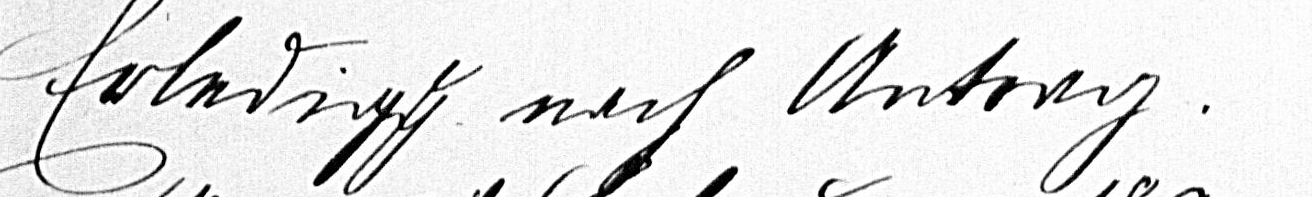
Erledigg nach Antrag.
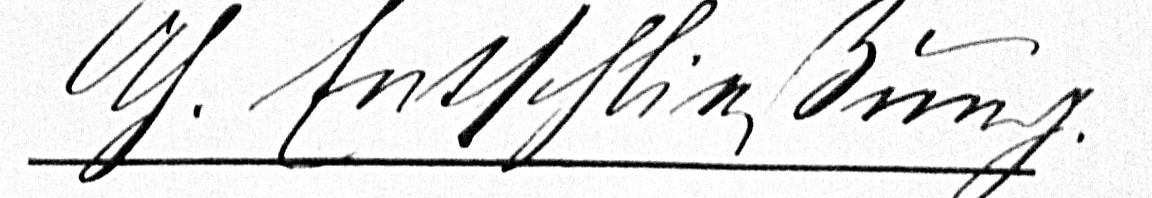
Ah. Entschließung.
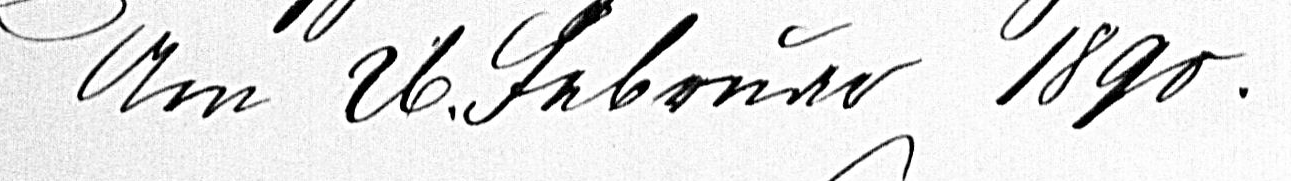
Am 26. Februar 1890.
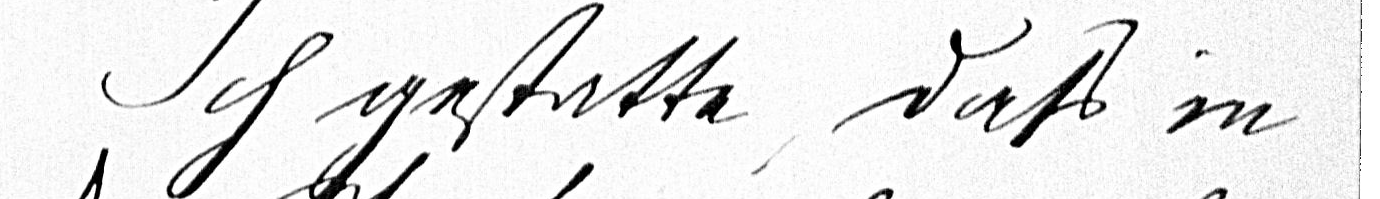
Ich gestatte, daß in
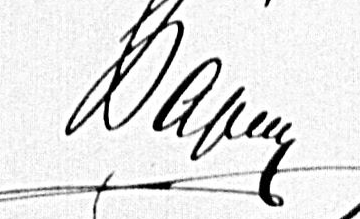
xx
